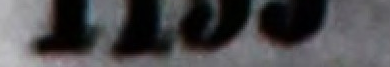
1155
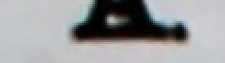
A.
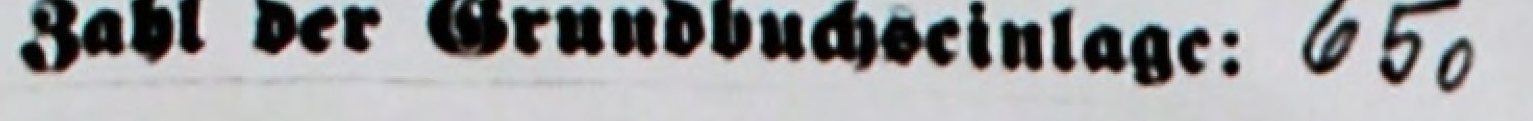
Zahl der Grundbuchseinlage: 650
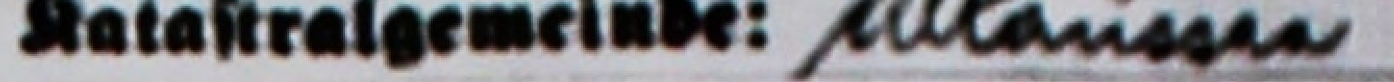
Katastralgemeinde: Altaussee
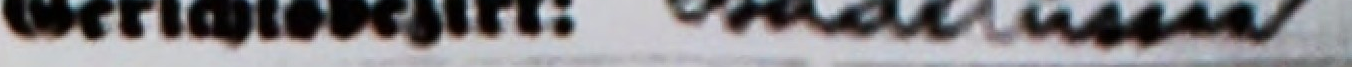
Gerichtsbezirk: Badaussee
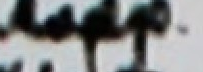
A???
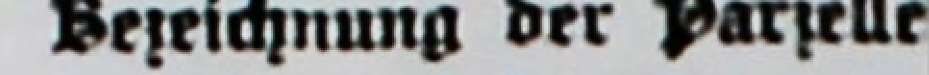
Bezeichnung der Parzelle
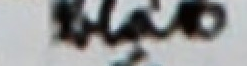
(Hausnummer, Kulturgattung)
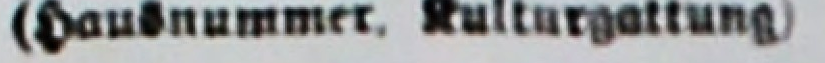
Blad
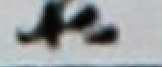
No
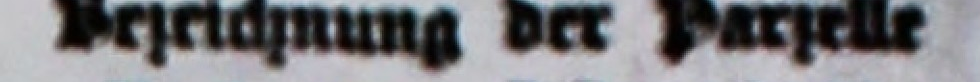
Bezeichnung der Parzelle
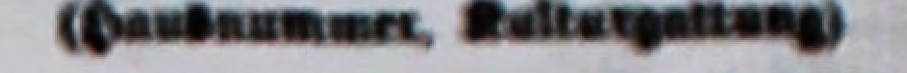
(Hausnummer, Kulturgattung)
